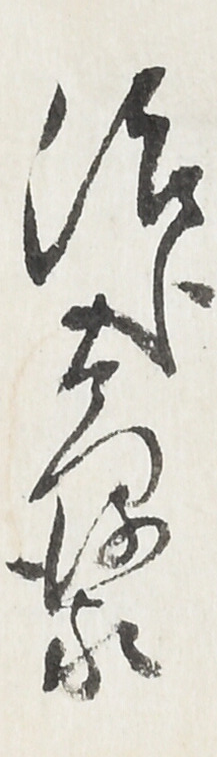治郎右衛門後家

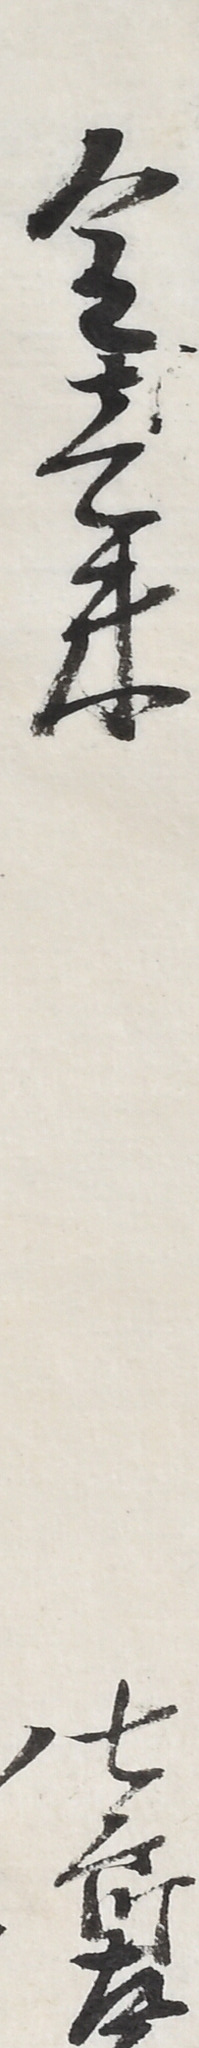一金壱朱七郎左衛門
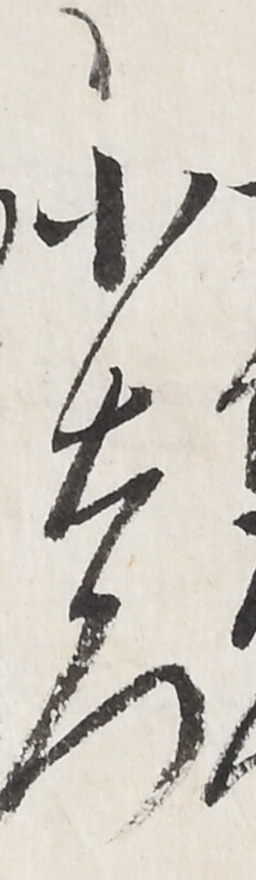小右衛門
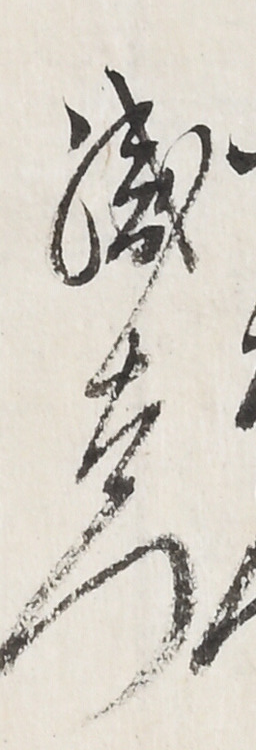小右衛門
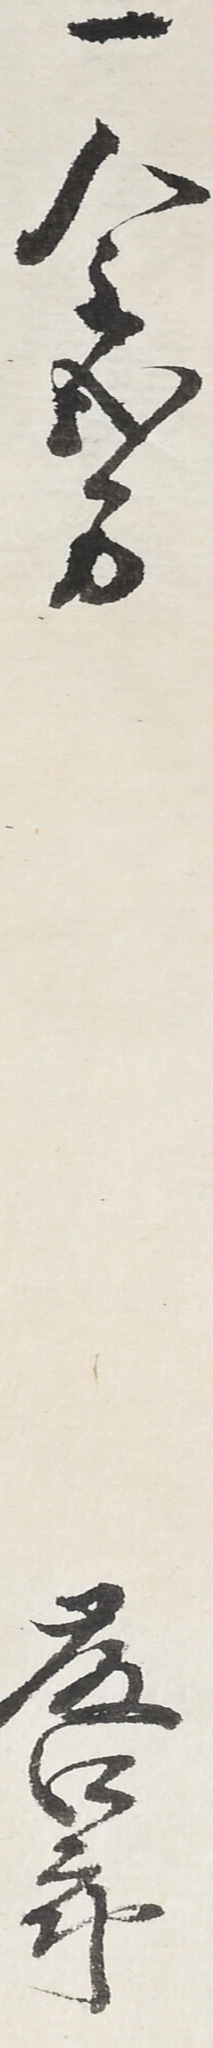一金弐分藤四郎
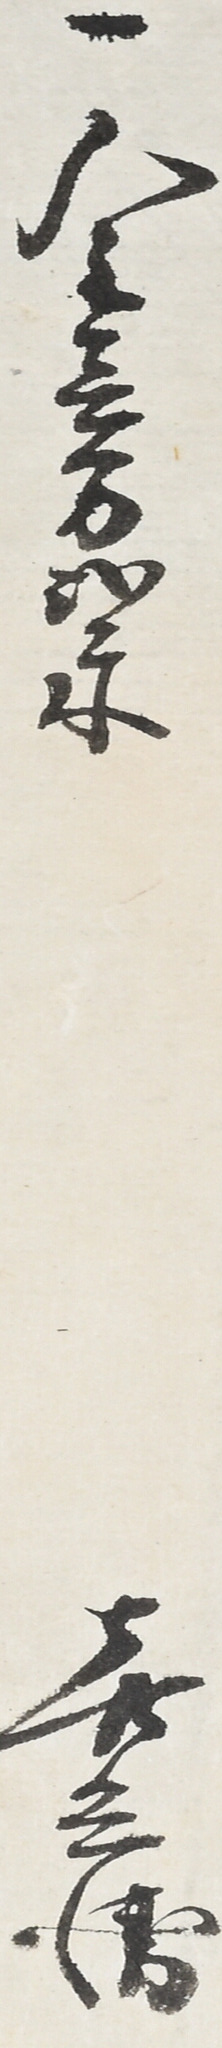一金壱分弐朱喜兵衛
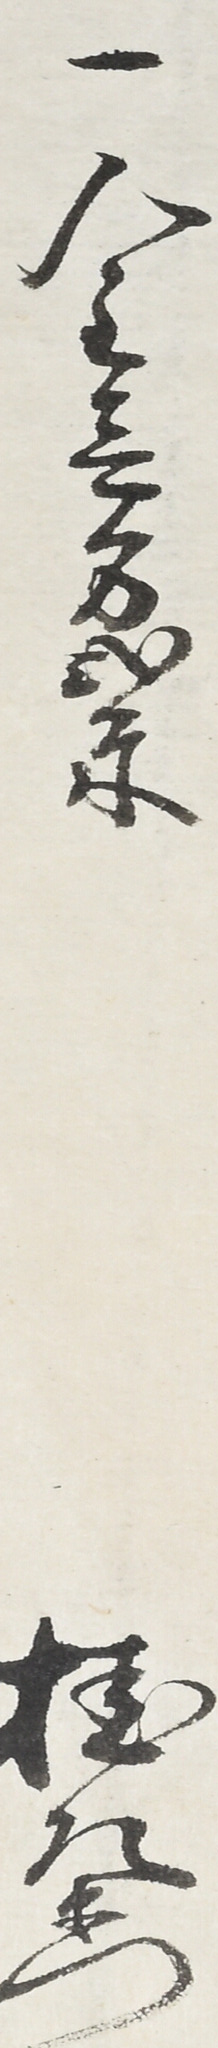一金壱分弐朱桂左衛門
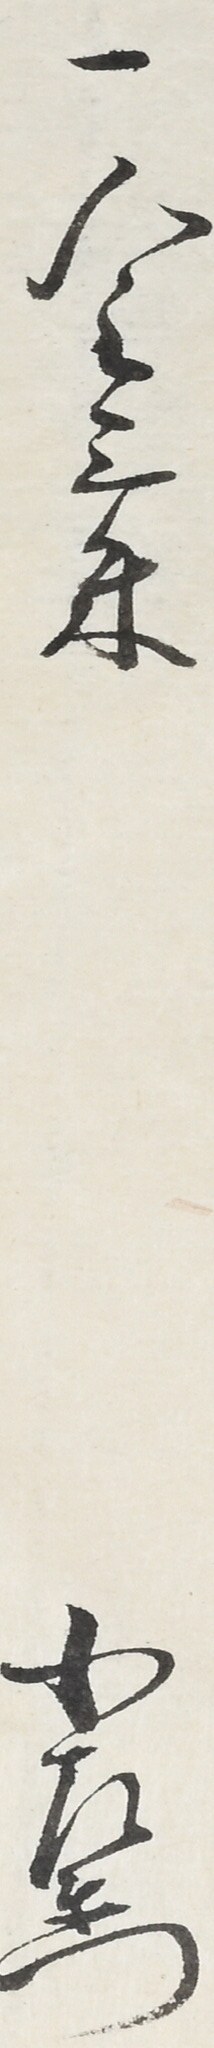一金三朱小左衛門
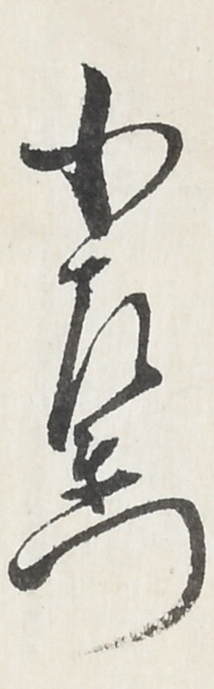小右衛門

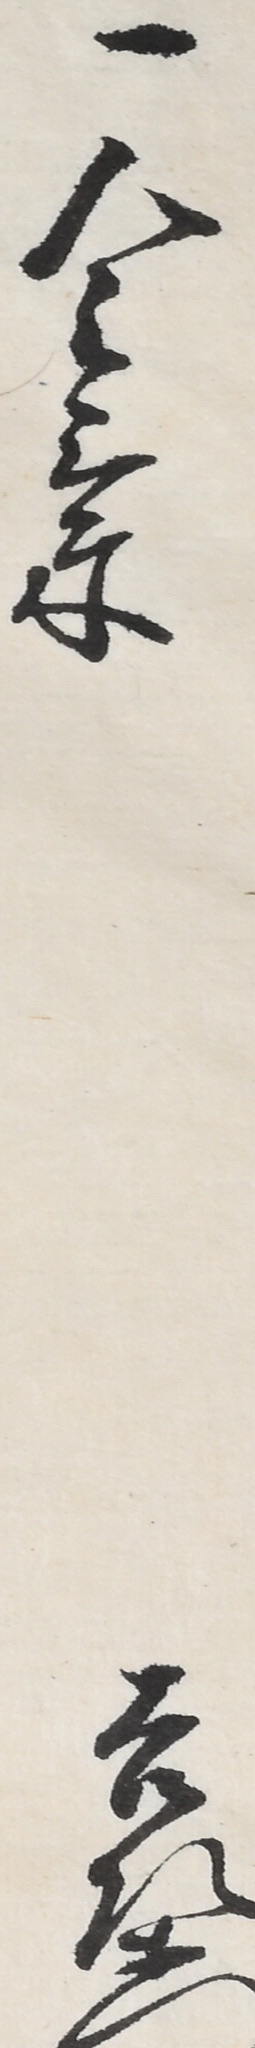一金三朱吉左衛門
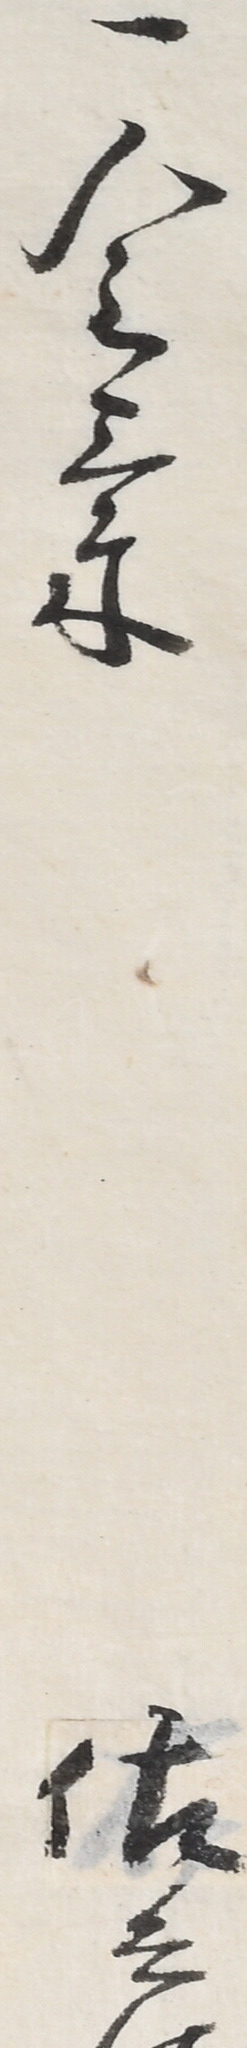一金三朱佐兵衛
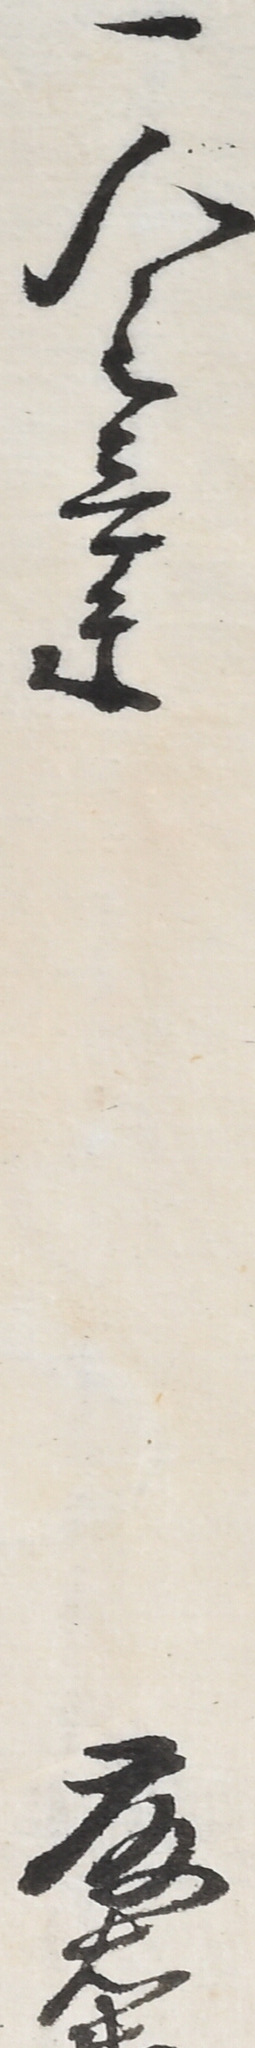一金壱朱藤右衛門
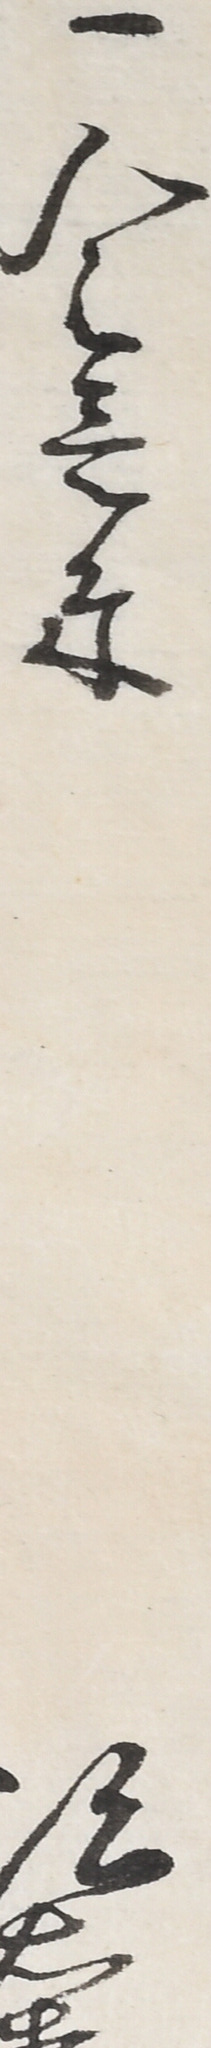一金壱朱治右衛門
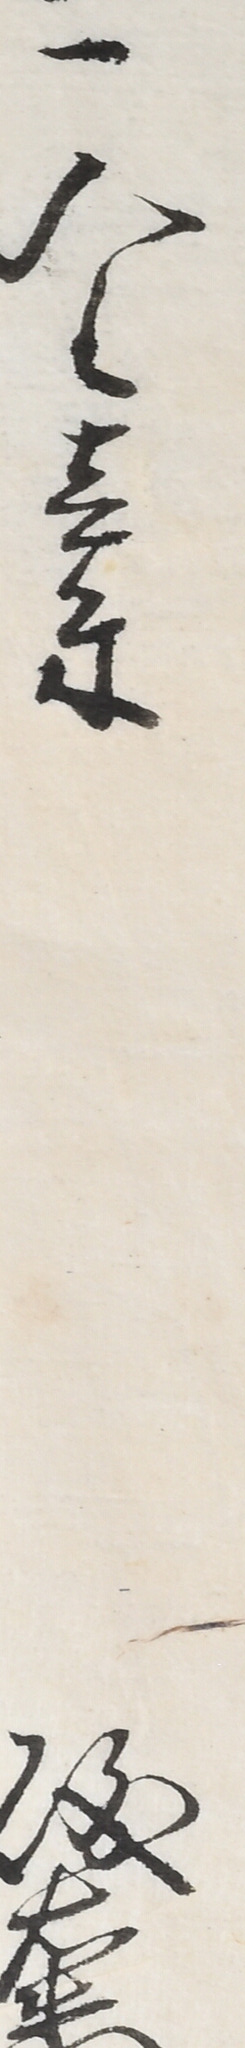一金壱朱磯右衛門
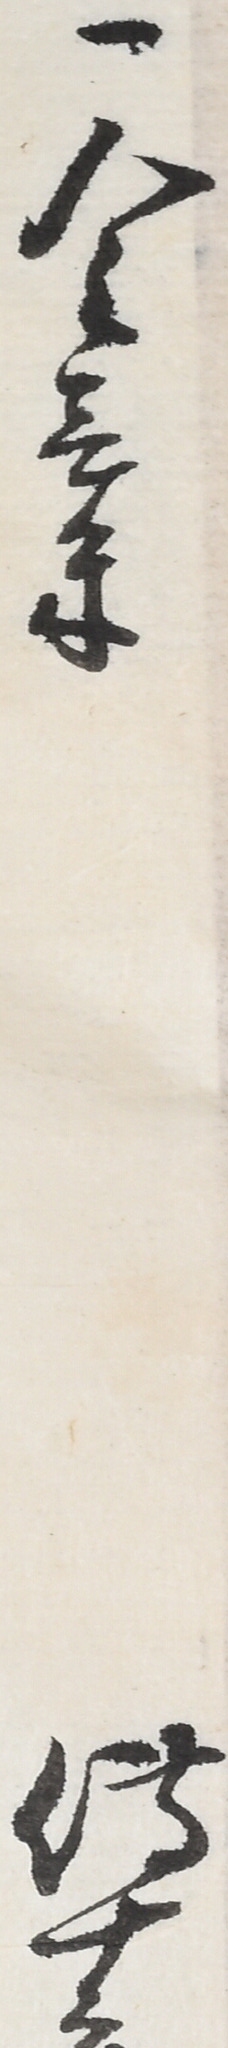一金壱朱伝十郎
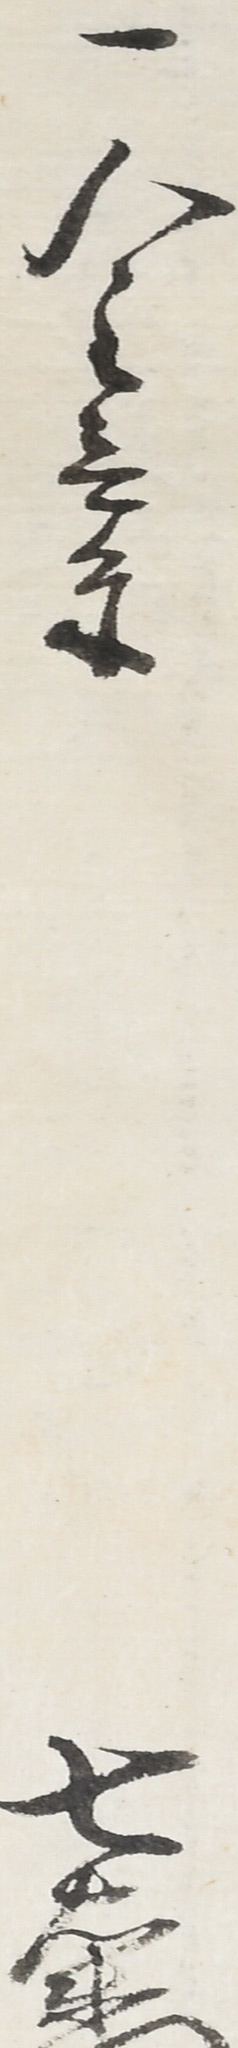一金壱朱七右衛門
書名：御拝地百五拾年御祝儀献上御目録名前
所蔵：伊那市立高遠町図書館・合同会社AMANE
